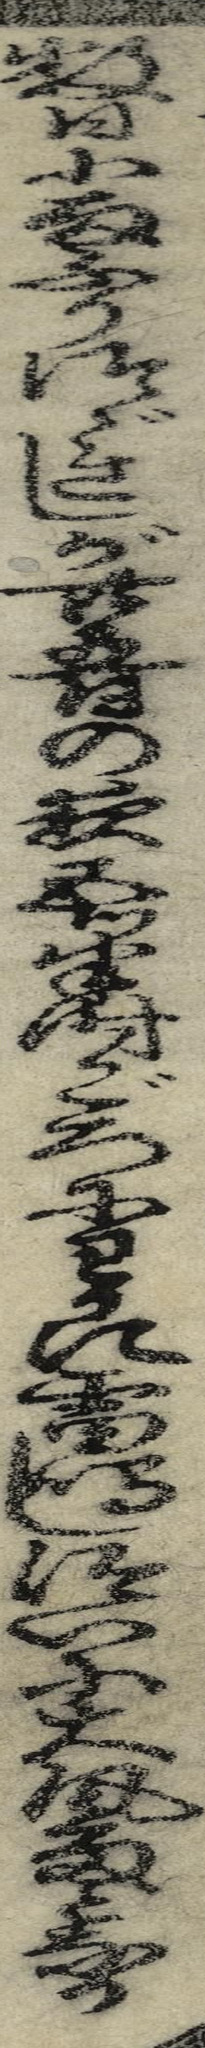数日小雨ふりつゞきしが廿五日の夜五ッ半時ごろにわかに雷鳴しついに大風雨となり
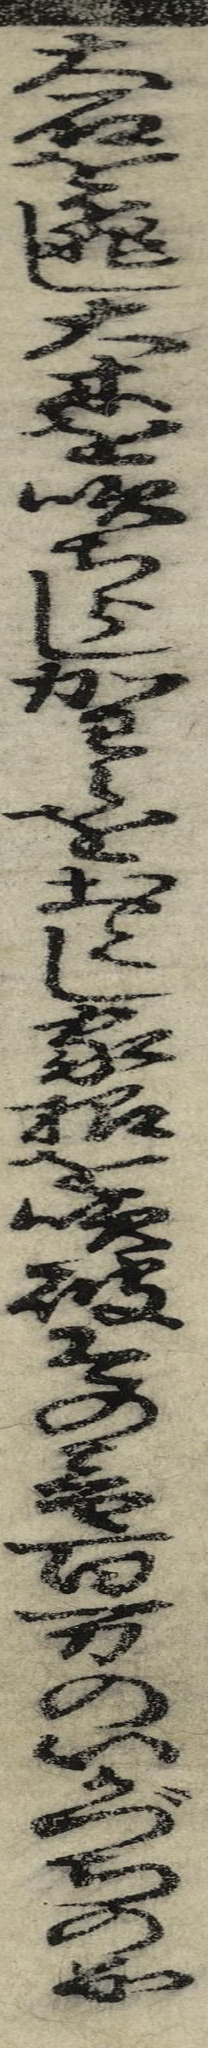大石を崩し大木を吹ちらしかわらをおとし家根を吹破その音百万のいかづちの如
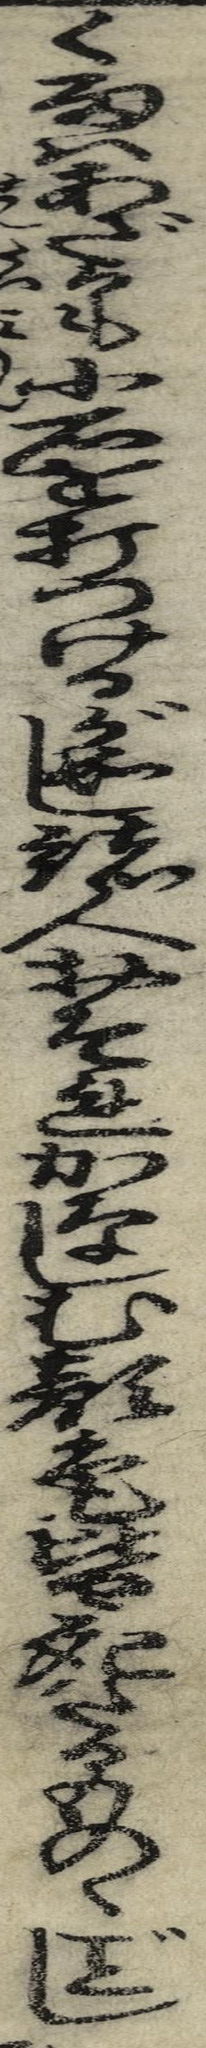く雨ハあだかも小石を打つけるが如し諸人おそれかなしむ顔色皆死たるものゝごとし
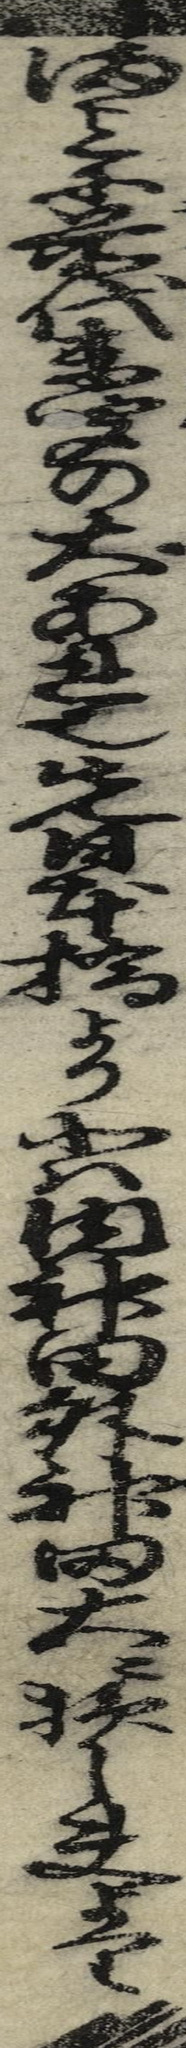まことに前代未聞の大あれ也先日本橋より北ハ内神田外神田大二損し夫より
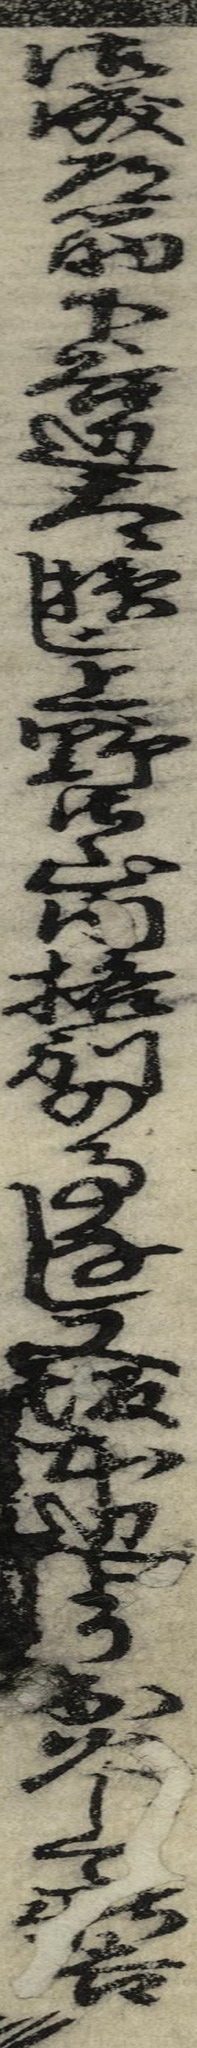御成道筋下谷辺大二損じ上野御山内格別の事なし又坂本辺より出火して新吉
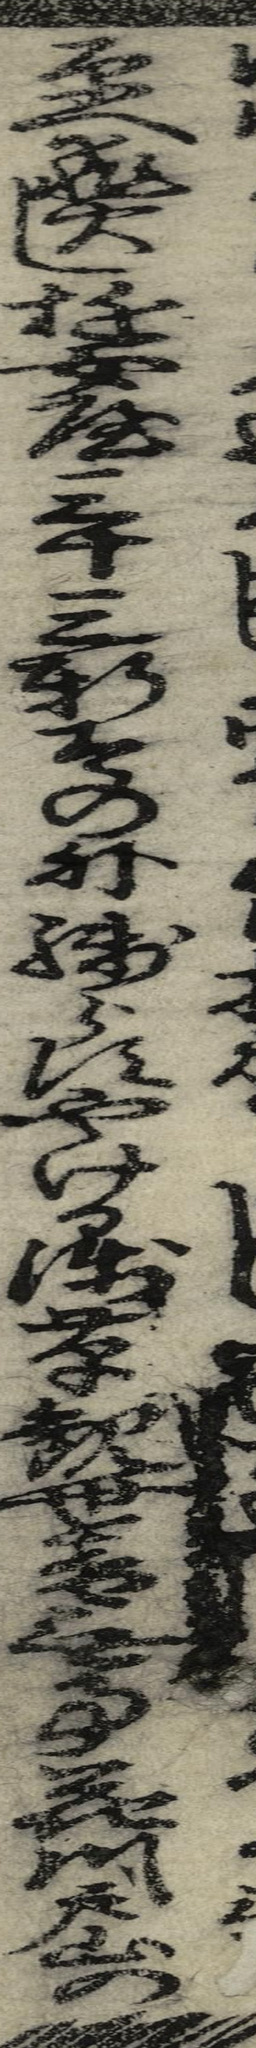原へ飛火し遊女屋三十三軒その外残らずやける浅草観世音無事花川戸山の
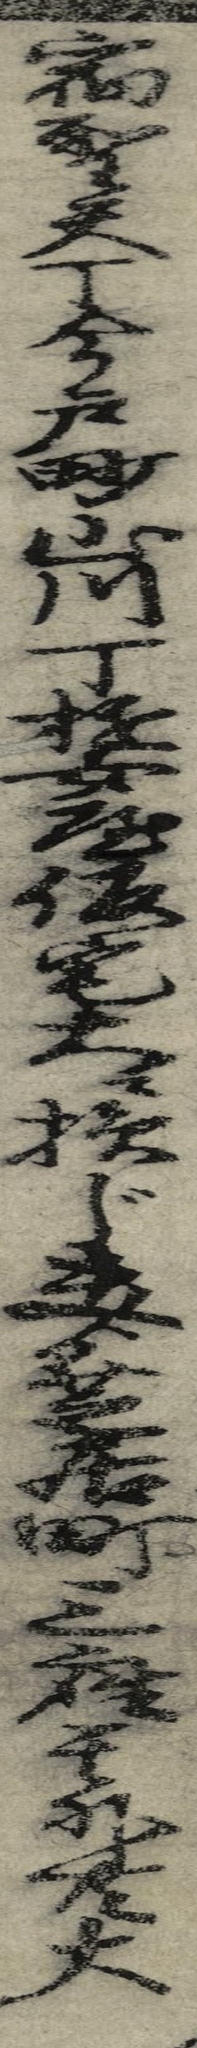宿聖天丁今戸町山川丁遊女屋仮宅大二損じ夫ゟ芝居三座其外共大
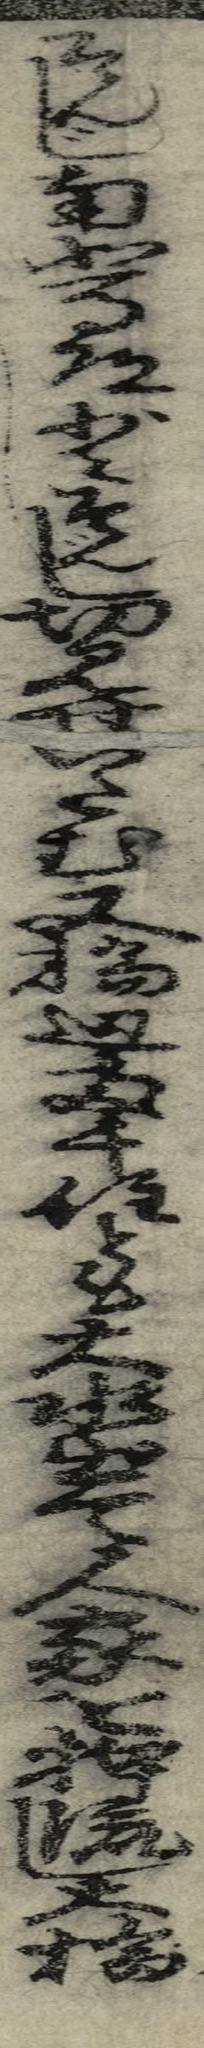そんじ南北馬道少々そんし切見世いたむ又橋辺両千住とも大水出て人家を押流し大橋
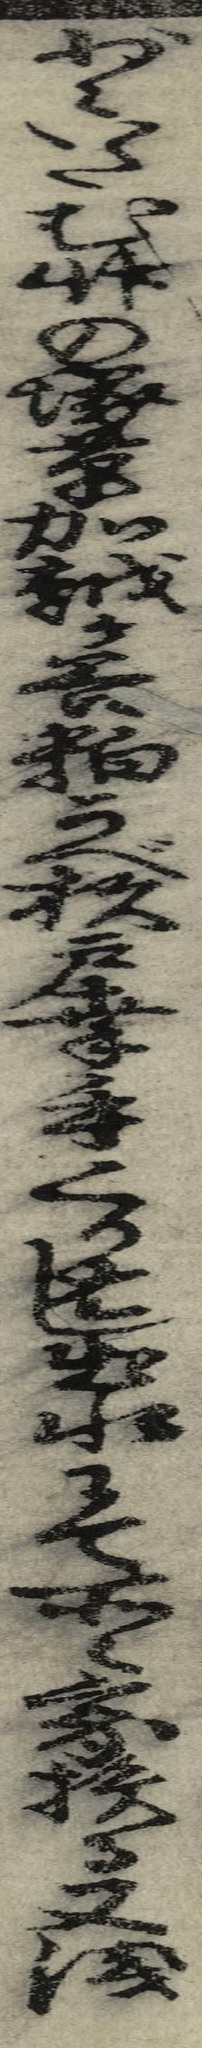少々いたむ竹の塀草加越ヶ谷粕かべ杉戸幸手くりはし出水にて所々家損る又浅
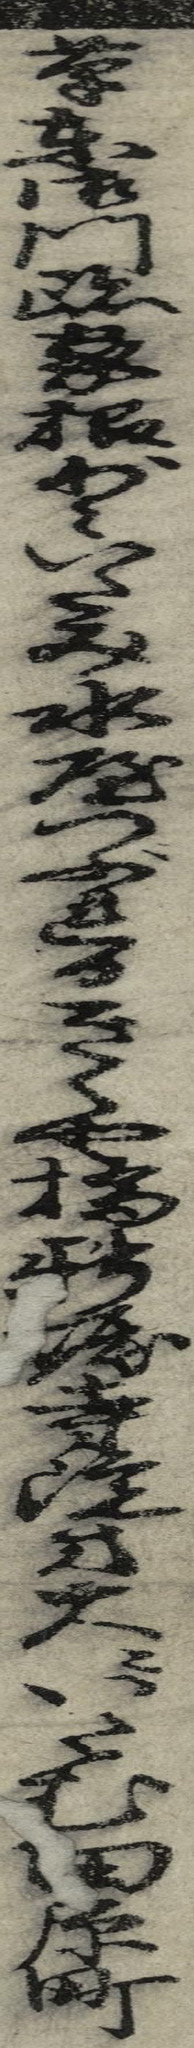草東御門跡家根少々いたみ水屋つぶれるきくや橋新堀寺院共大二いたむ田原町
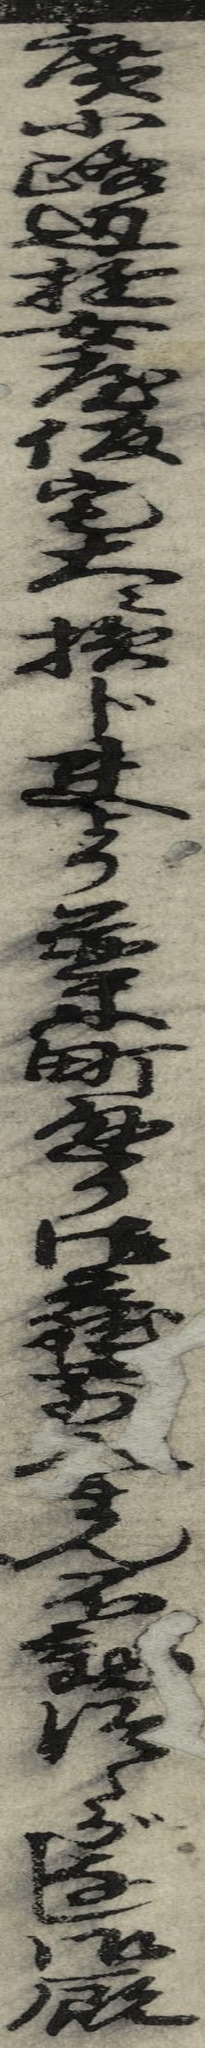広小路辺遊女屋仮宅大二損じ夫より並木町通り御蔵前八まん不動つゝがなし御厩
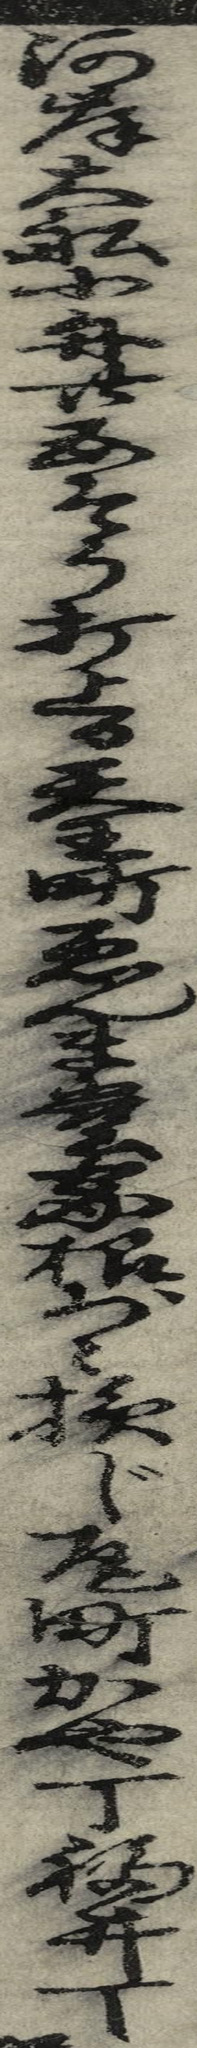河岸大船小舟共五そう打上る天王町ゑんま堂家根少々損じ瓦町かや丁福井丁
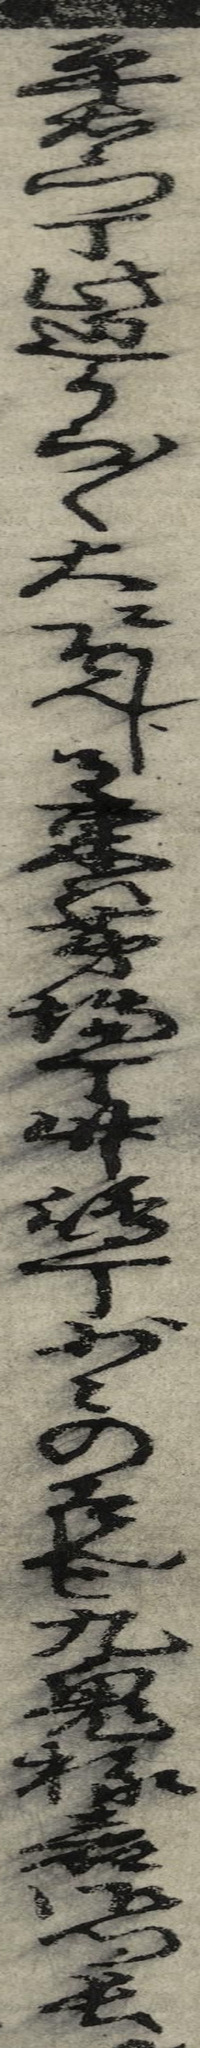平右衛門丁此辺うら〳〵大二そんじる東ハ茅場丁竹嶋丁少々のそんじ九鬼様表御門長
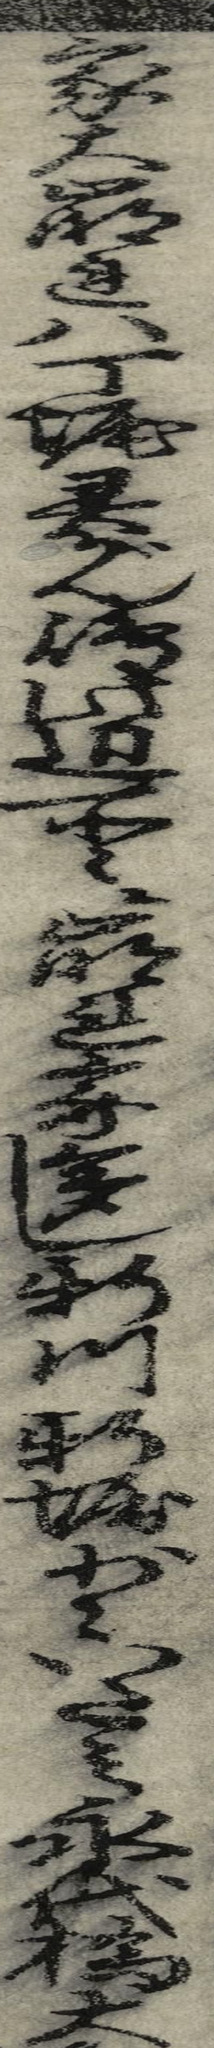家大崩れ八丁堀霊がん嶋此辺所々二崩れ家多し新川新堀少々いたミ永代橋大
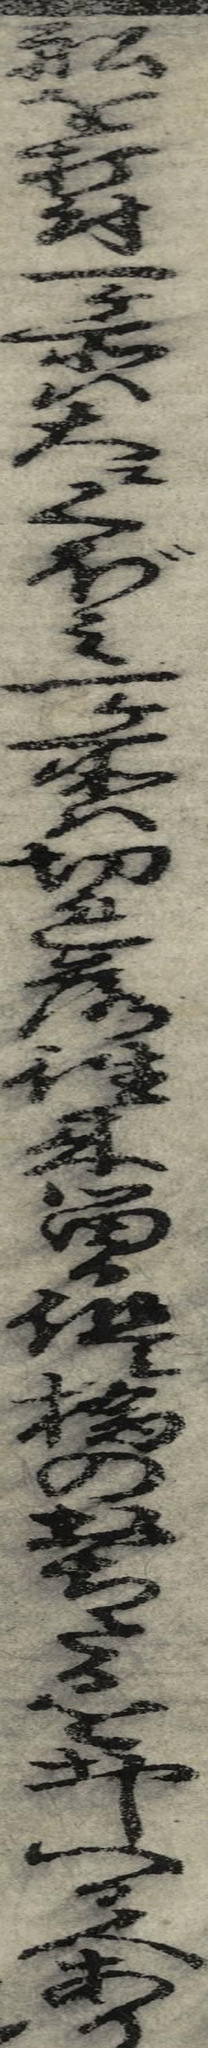船を打付一ヶ所ハ大二くぼミ一ヶ所ハ切れ落ち往来留る但し橋のおちたるをおしへる人あり
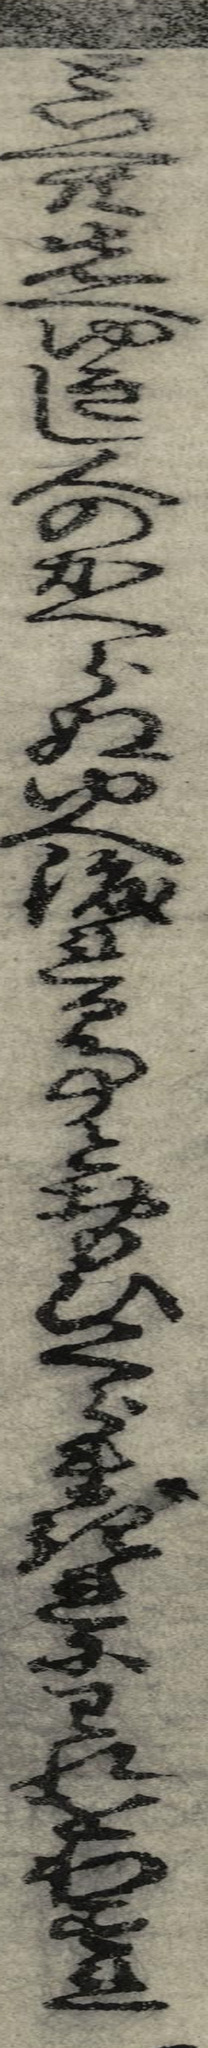といへ共先へゆきし人のかへらぬゆへ渡れる事とおもひくらまぎれにわれをわすれ
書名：安政三辰八月廿五日　大風雨出水損場所之圖
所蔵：東京大学地震研究所図書室 Earthquake Research Institute Library, The University of Tokyo, JAPAN
